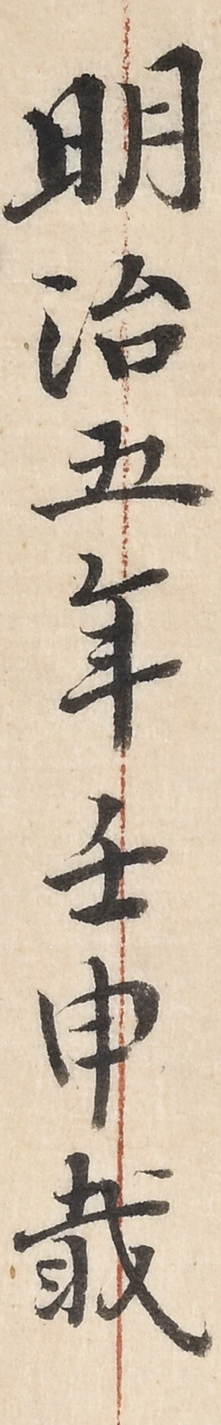明治五年壬申載
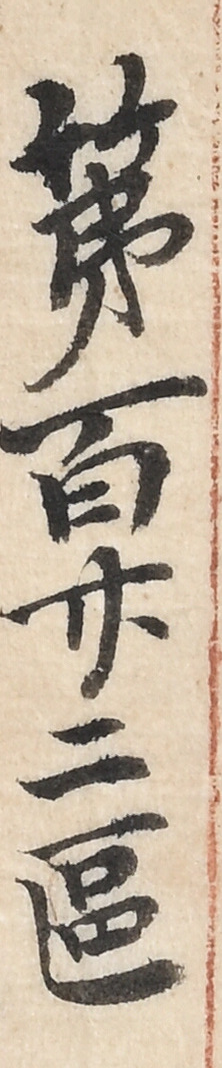第百廿二区
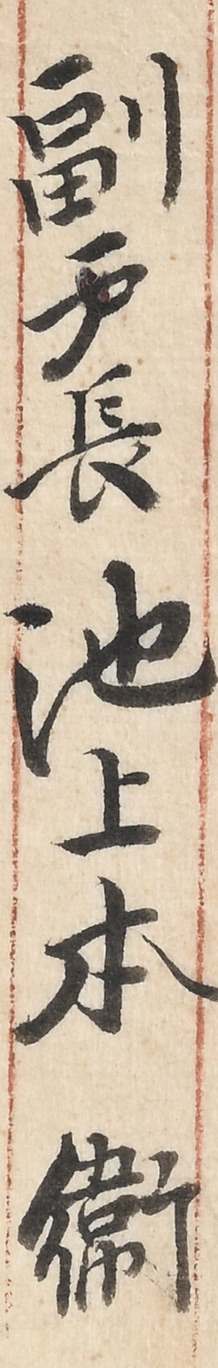副戸長池上本衛

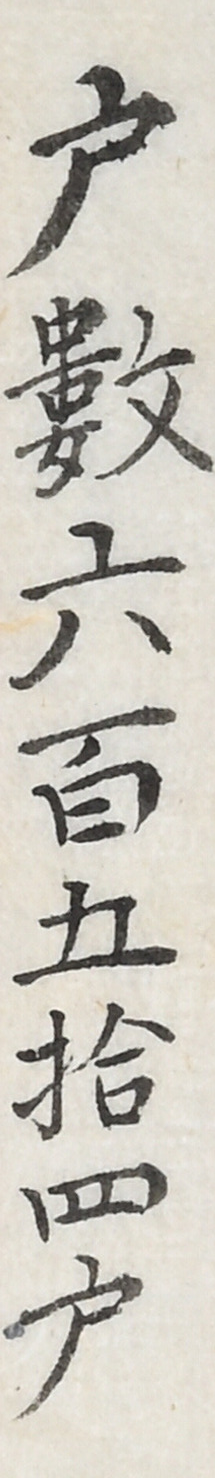戸数六百五拾四戸
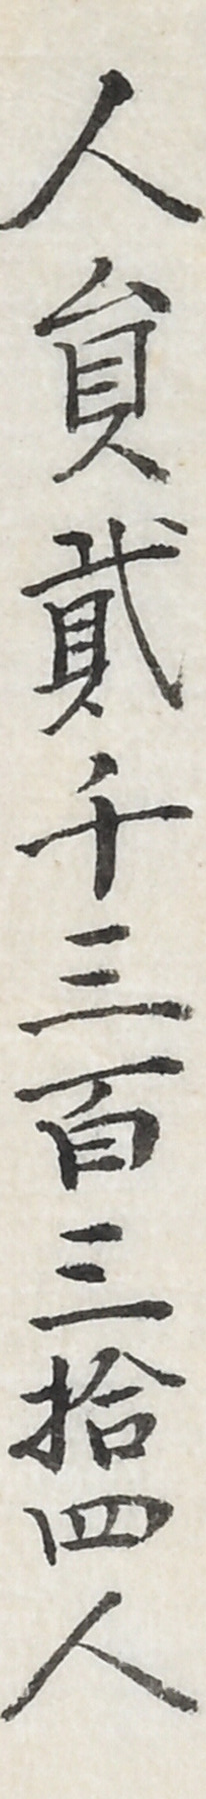人員弐千三百三拾四人
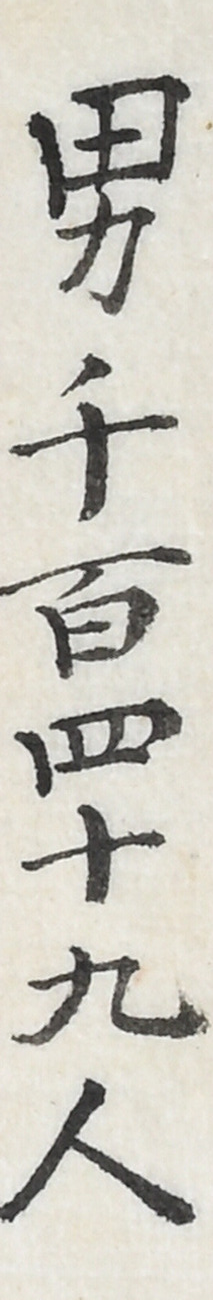男子千百四十九人
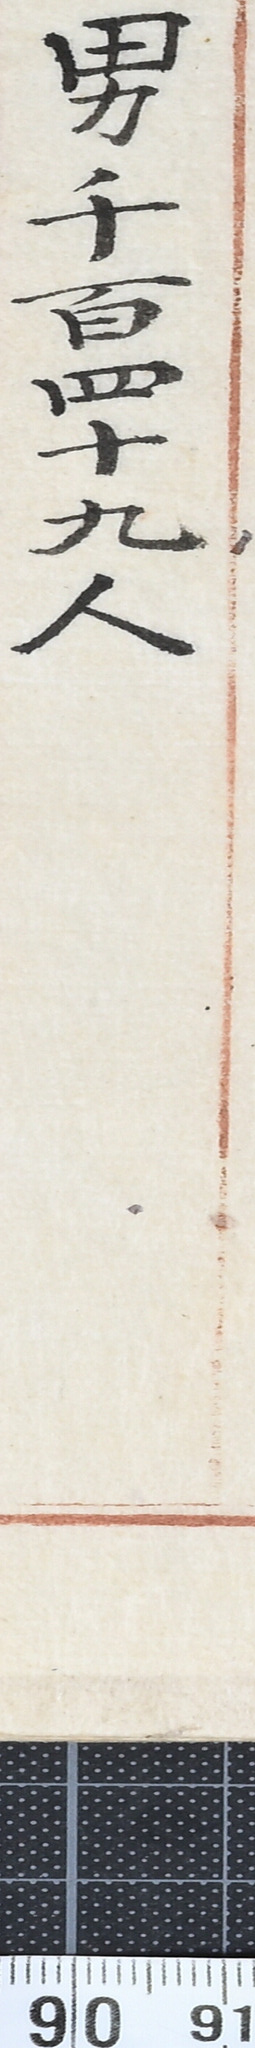男子千百四十九人
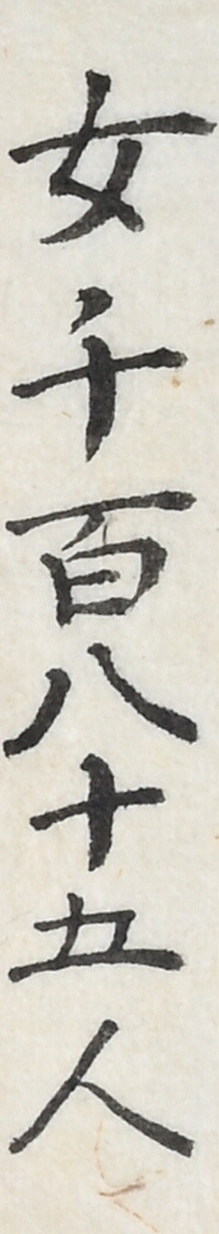女子千百八十五人
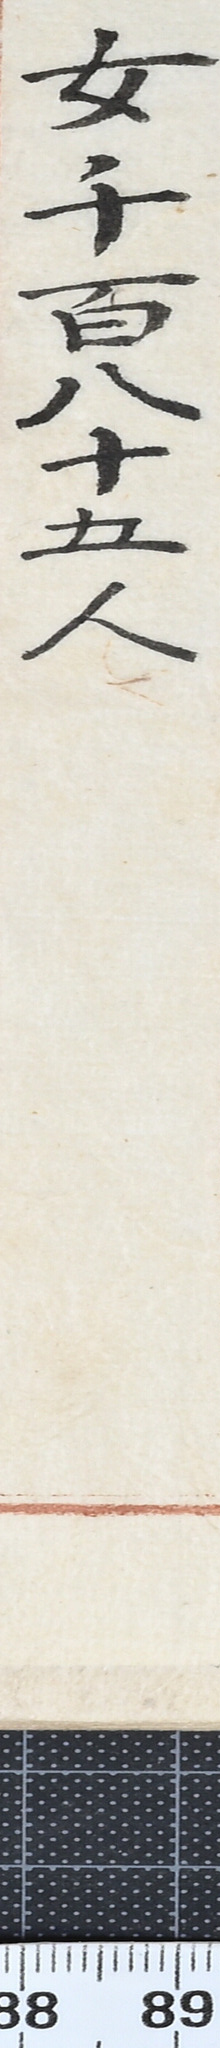女子千百八十五人
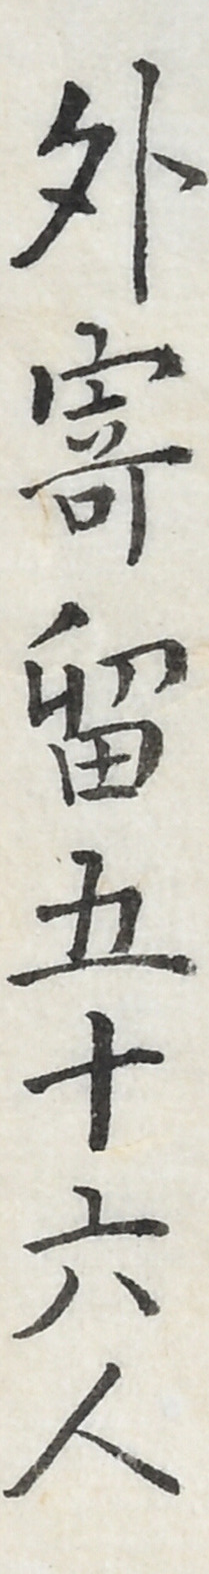外寄留五十六人

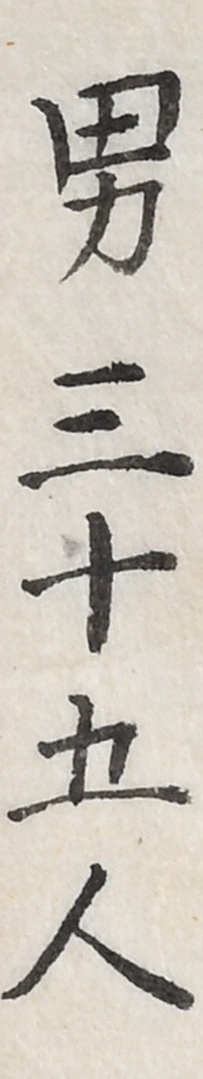男三十五人
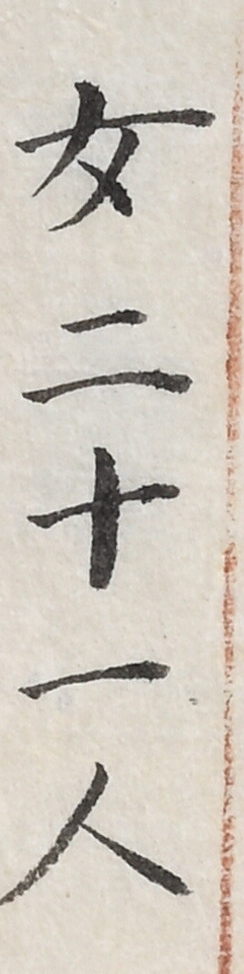女二十一人
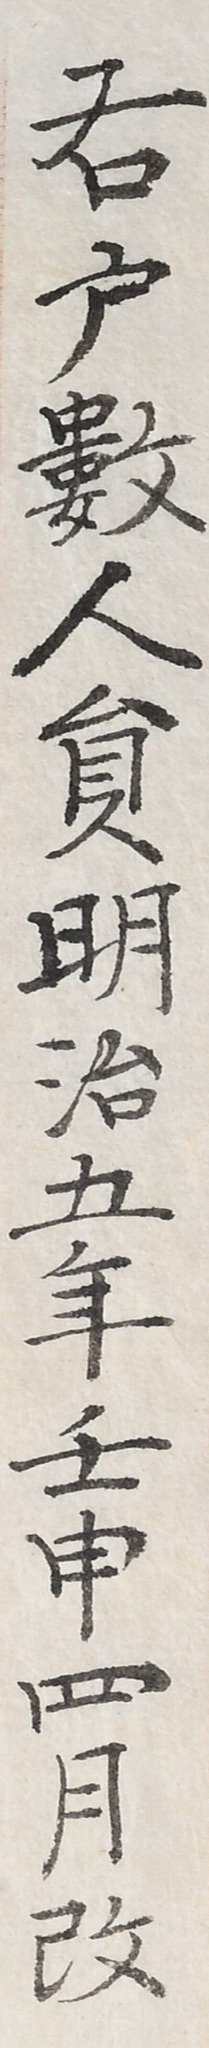右戸数人員明治五年壬申四月改
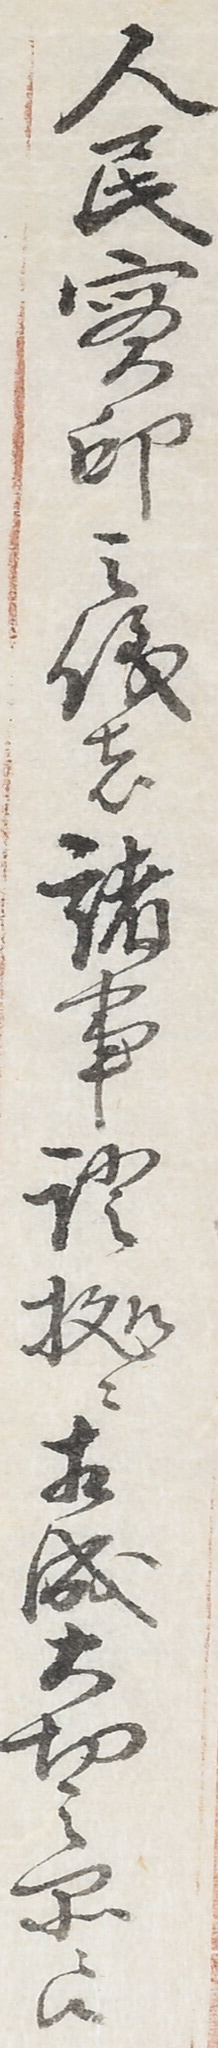人民実印之儀は諸事証拠に相成大切之品に候
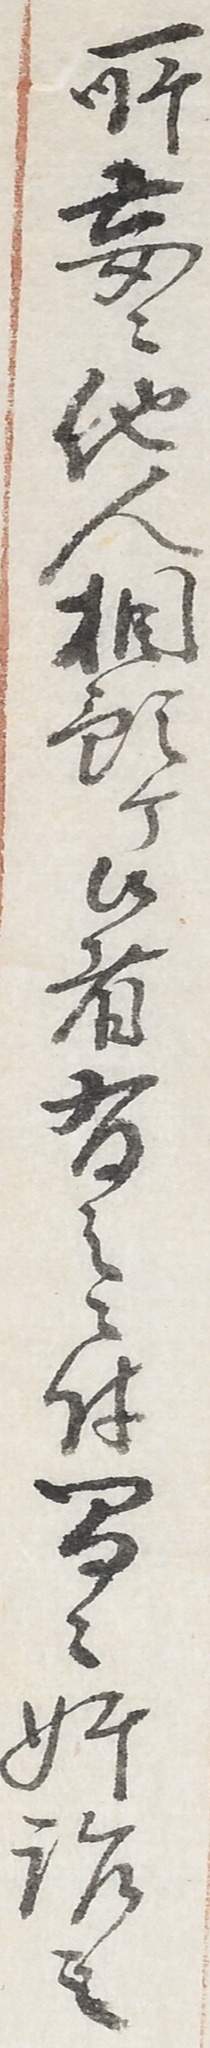所妄に他人相預け候者有之に付間々奸詐之
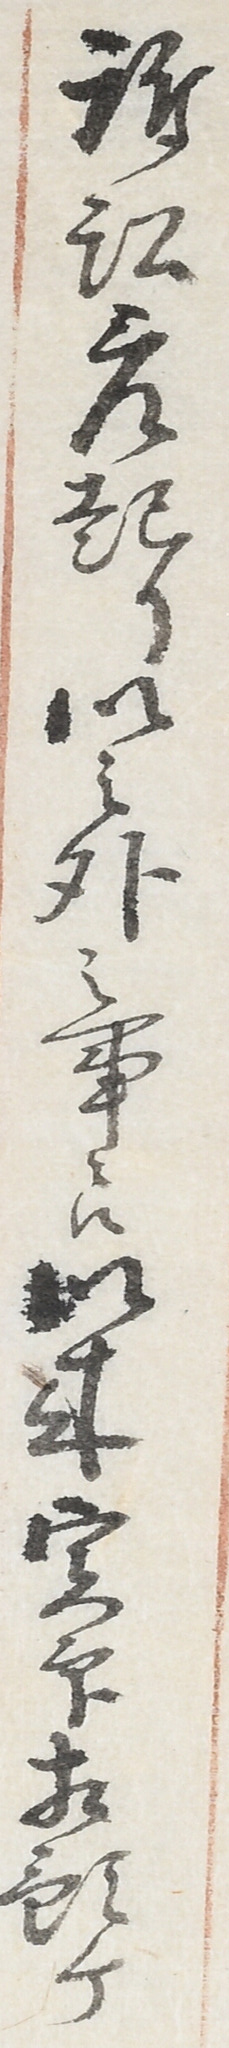訴訟差起り以之外之事に候以来実印相預け
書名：壹番・御布告一式
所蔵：伊那市立高遠町図書館・合同会社AMANE
